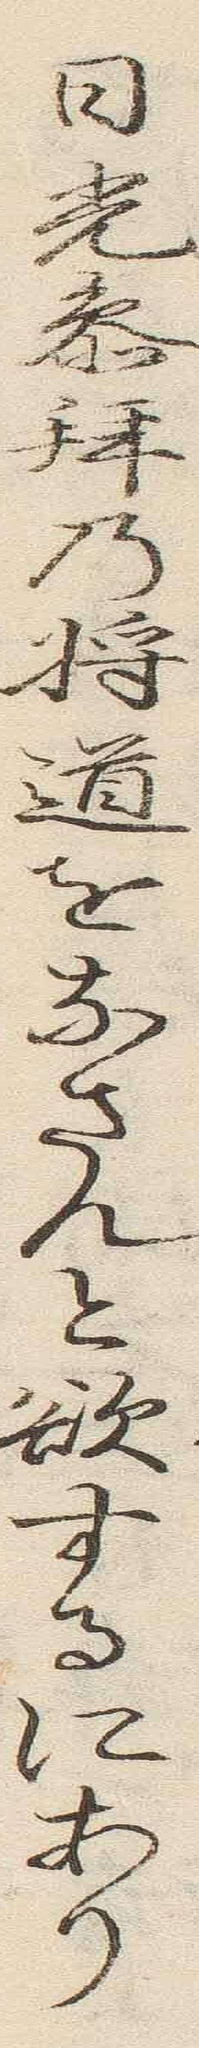日光叅拜の将道をなさんと欲するにあり
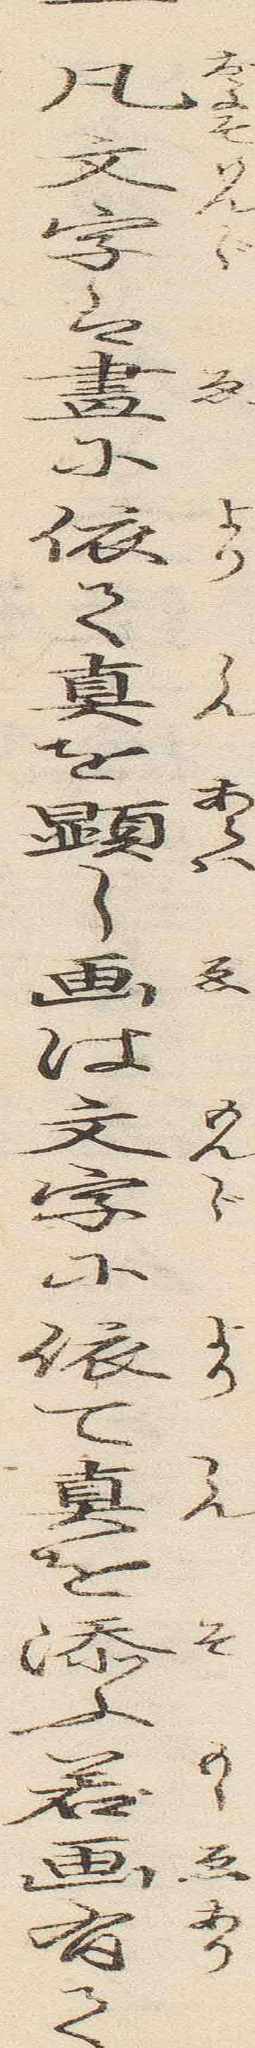一凡文字は畫に依て真を顕し画は文字に依て真を添ふ若画有て
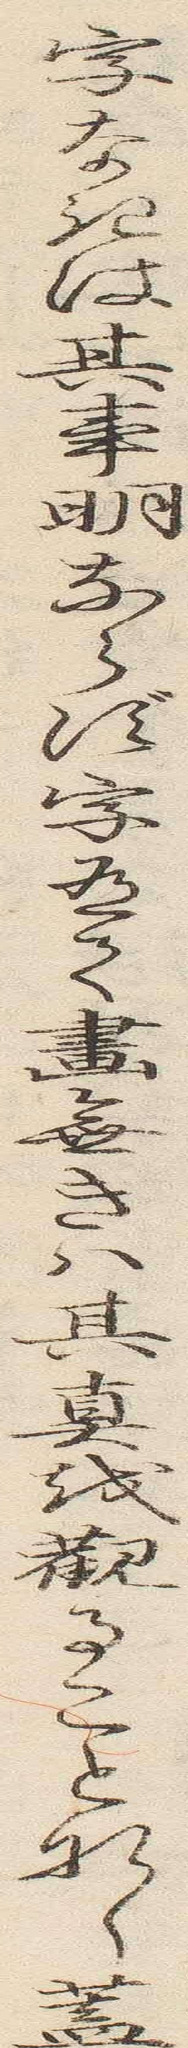字なきは其事明ならず字有て畵無きは其真を觀ることなし蓋
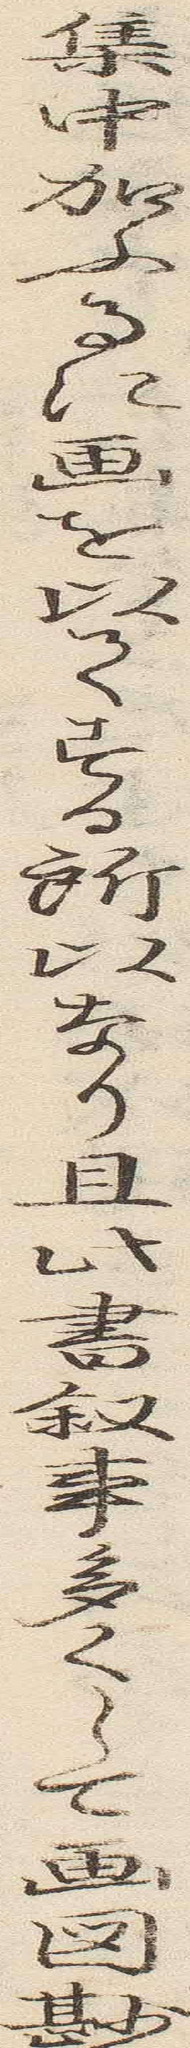集中加ふるに画を以てする所以なり且此書叙事多くして画図尠
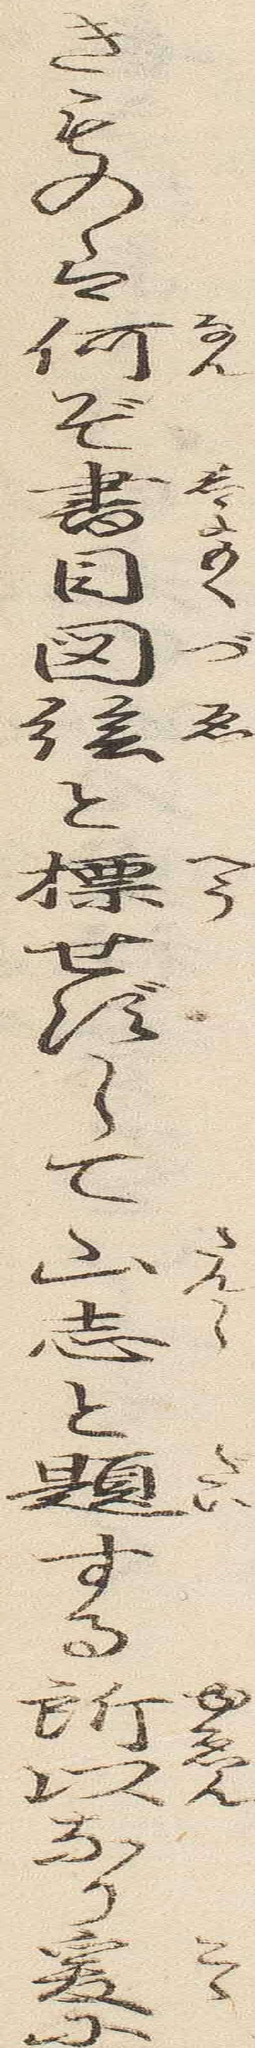きものは何ぞ書目図繪と標せずして山志と題する所以なり爰に
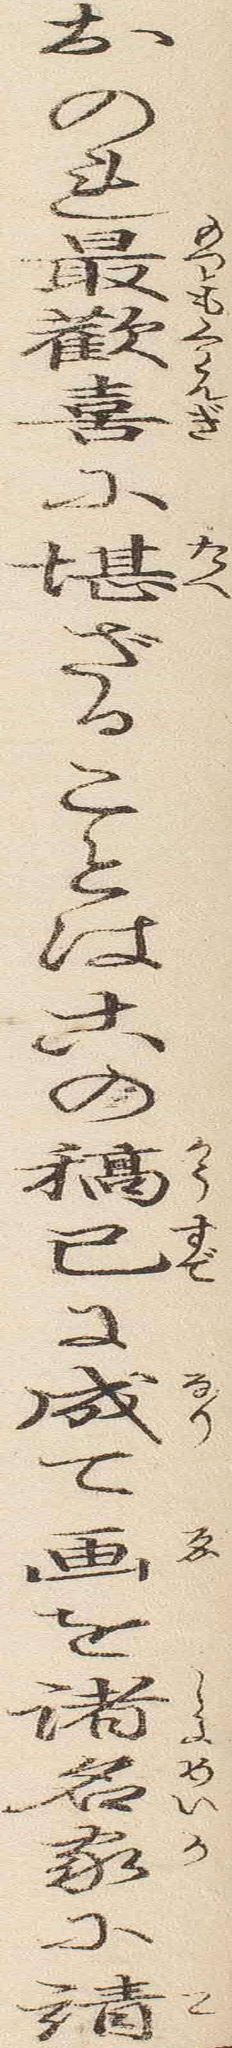おのれ最歡喜に堪ざることはこの稿已に成て画を諸名家に請
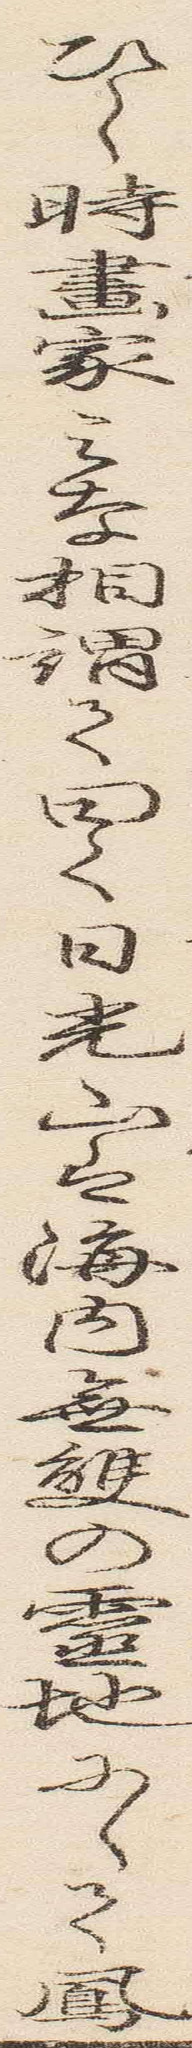ひし時畵家みな相謂て曰く日光山は海内無雙の靈地にして鳳
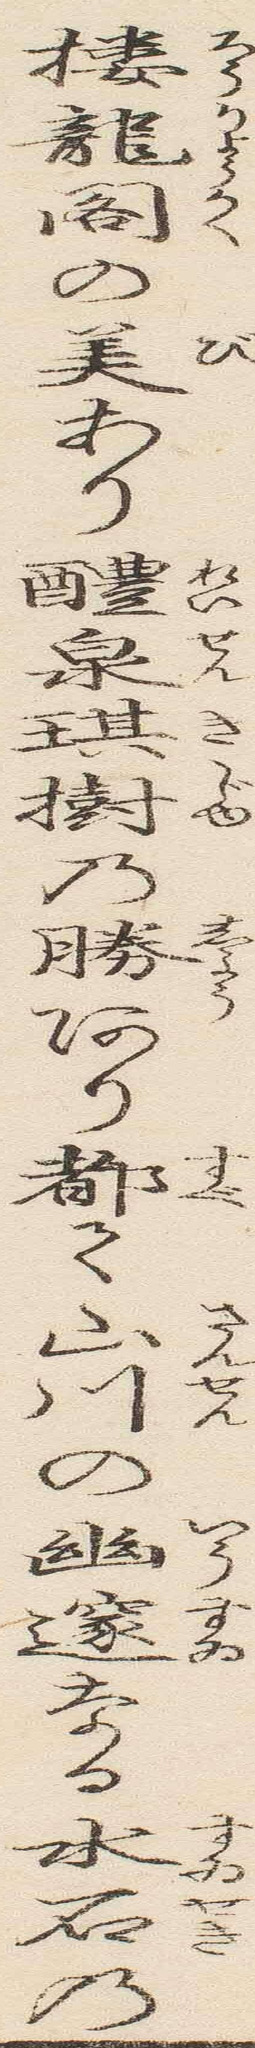楼龍閣の美あり醴泉琪樹の勝あり都て山川の幽邃なる水石の
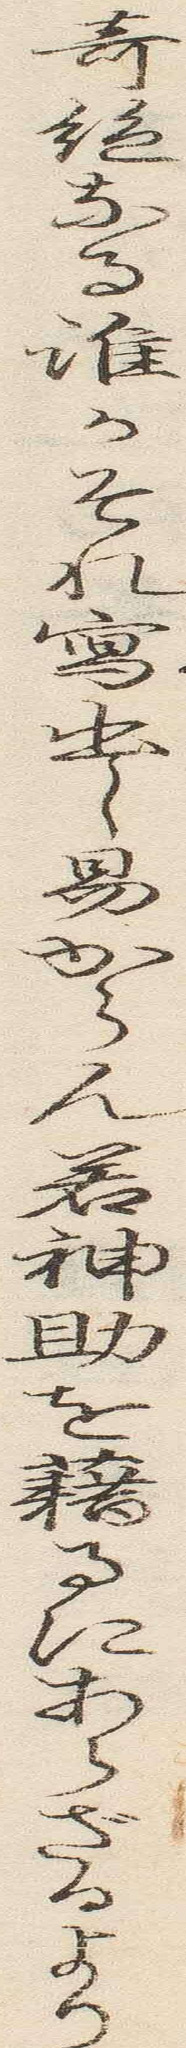竒絶なる誰かそれ寫出し易からん若神助を藉るにあらざるより
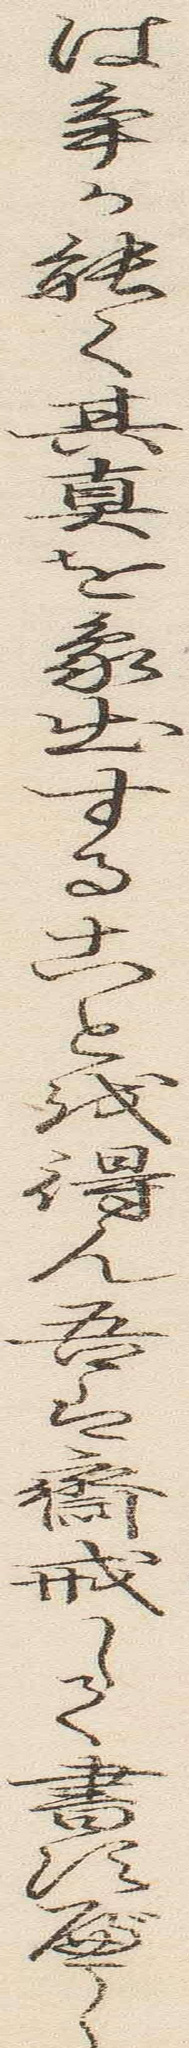は争か能く其真を象出することを得ん吾は齋戒して書すべし
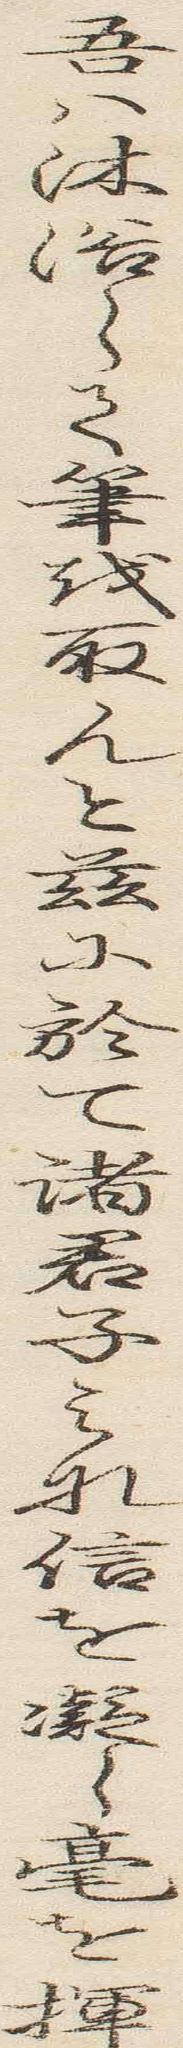吾は沐浴して筆を取んと茲に於て諸君子みな信を凝し毫を揮
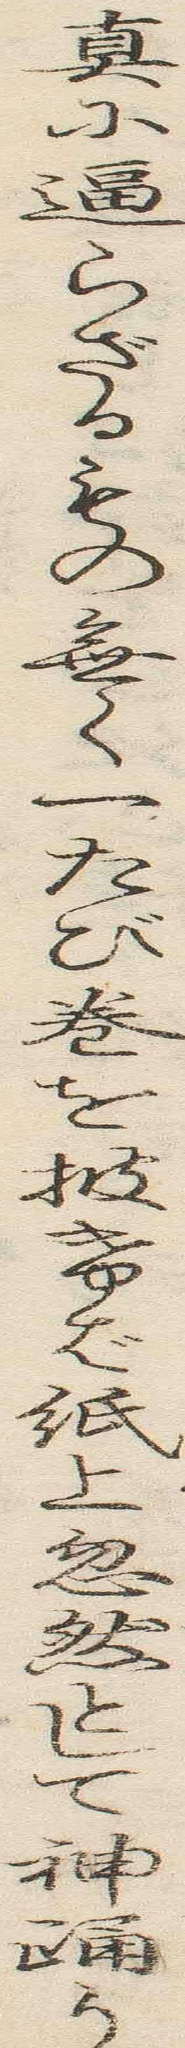真に逼らざるもの無く一たび巻を披けば紙上忽然として神踊り
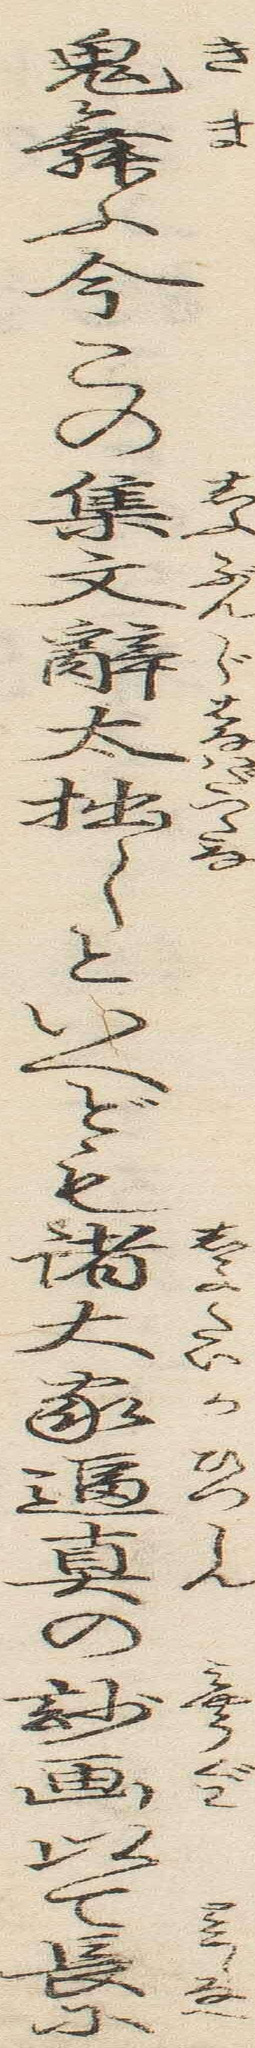鬼舞ふ今この集文辭太拙しといへども諸大家逼真の玅画以て長に
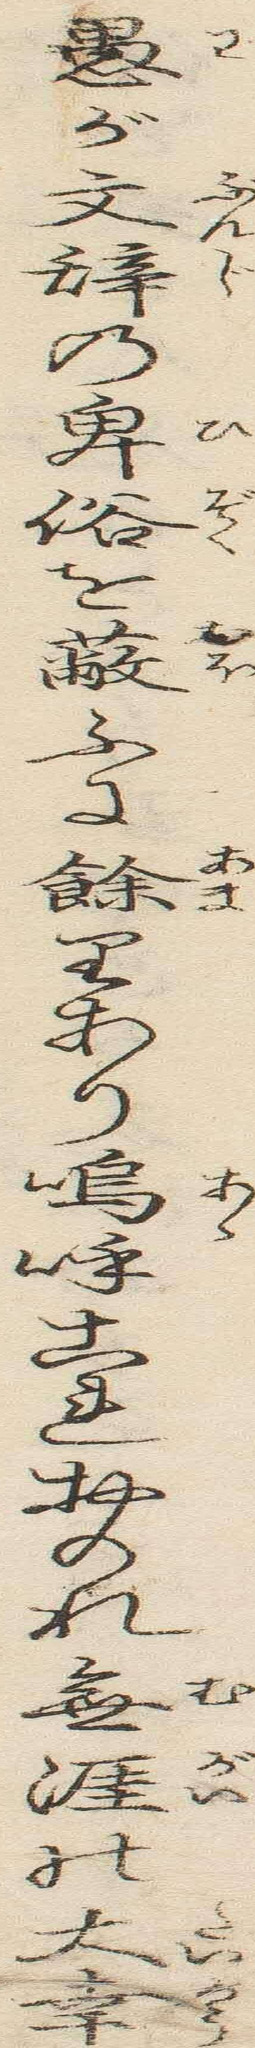愚が文辭の卑俗を蔽ふに餘りあり嗚呼これおのれ無涯の大幸
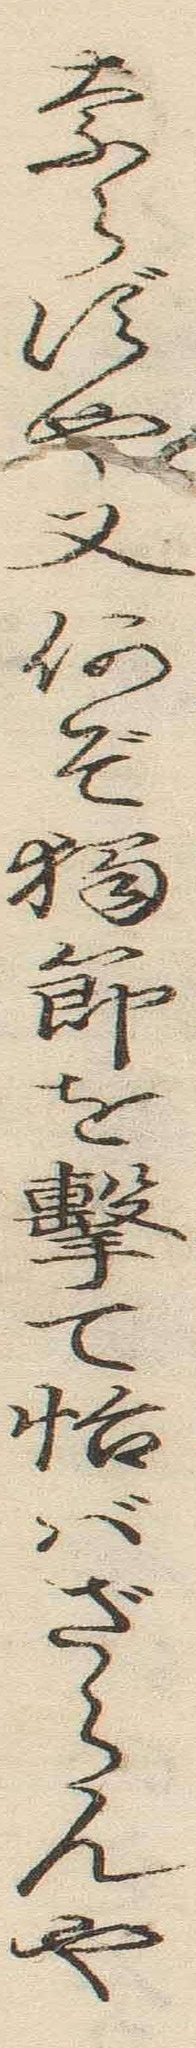ならずや又何ぞ獨節を擊て怡ばざらんや

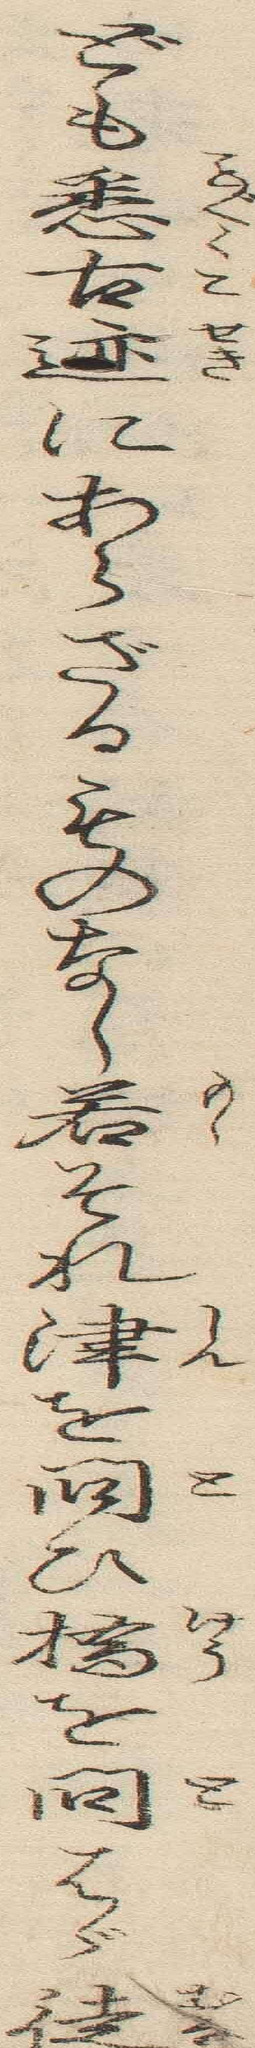ども悉古迹にあらざるものなし若それ津を問ひ撟を問はゞ徒
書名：日光山志
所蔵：東京学芸大学附属図書館 国文学研究資料館
